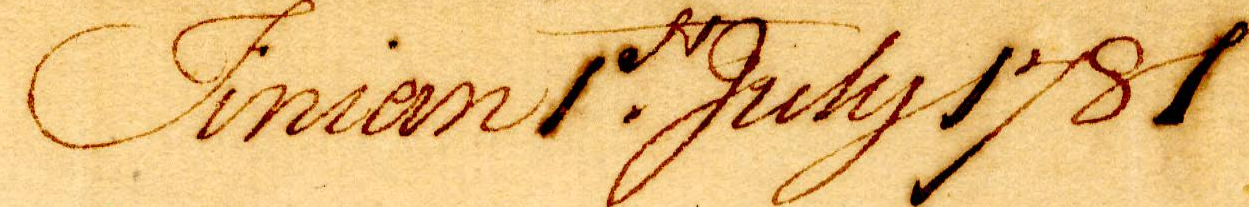Tinian 1^st July 1781
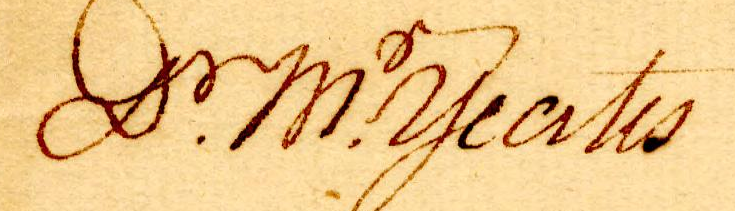D^r M^r. Yeates
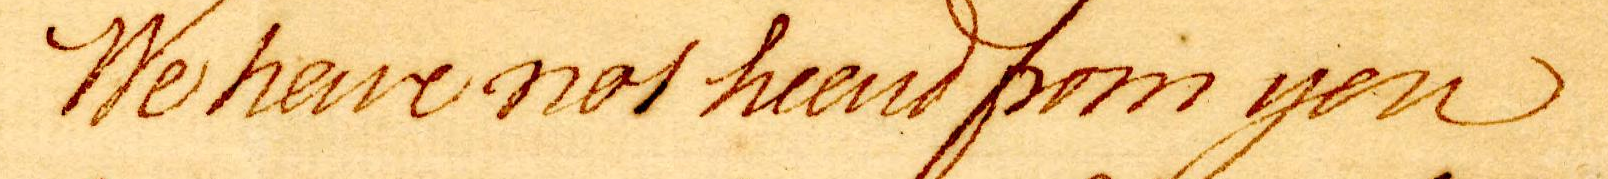We have not heard from you
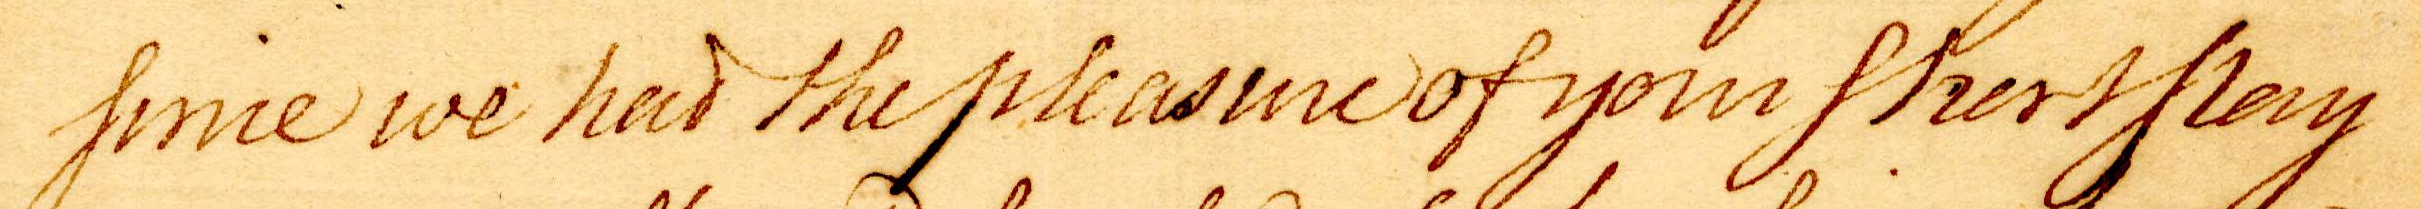since we had the pleasure of your short glory
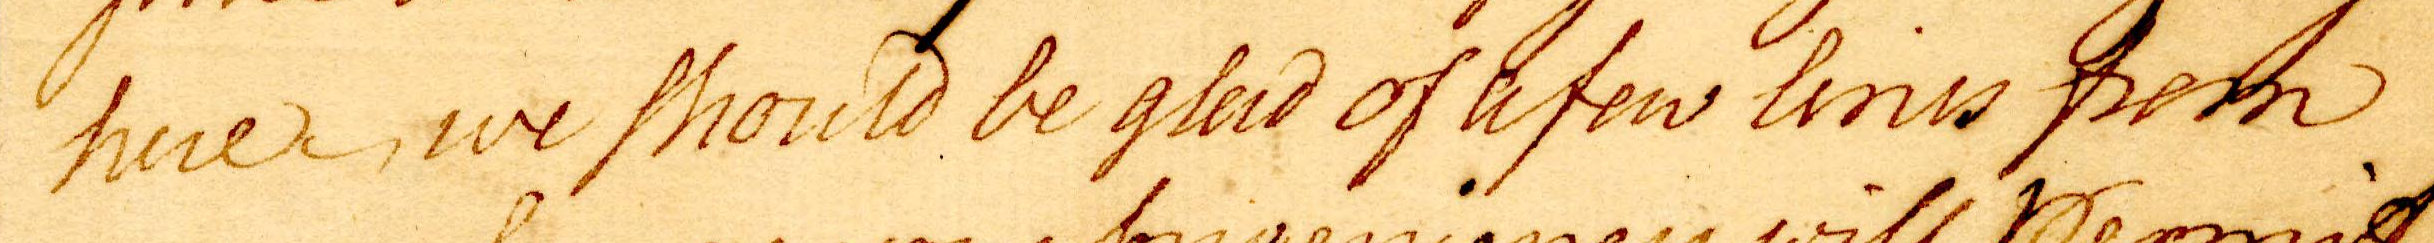here. we should be glad of a few lines from
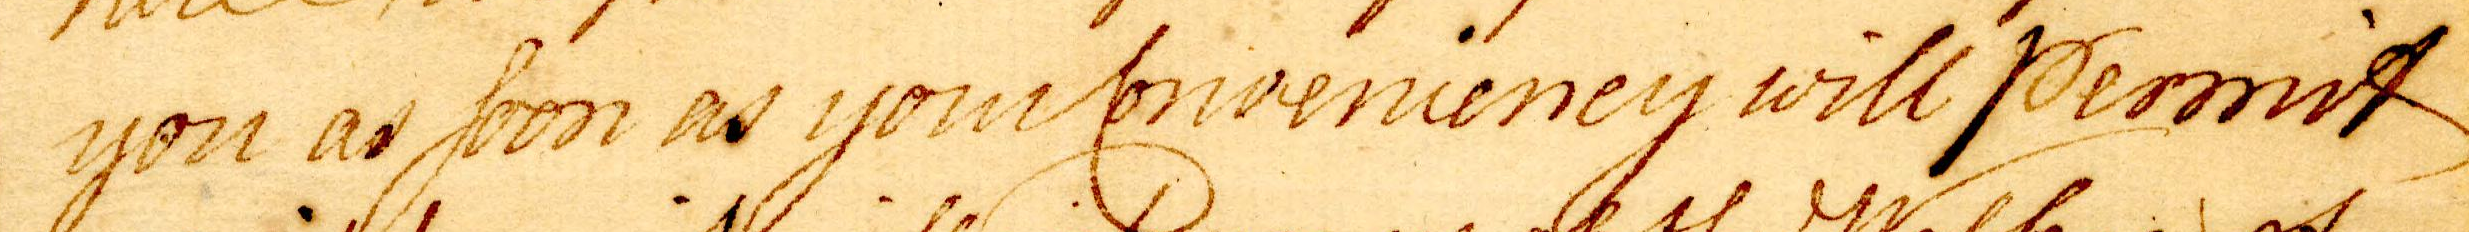you as soon as your Conveniency will Permit
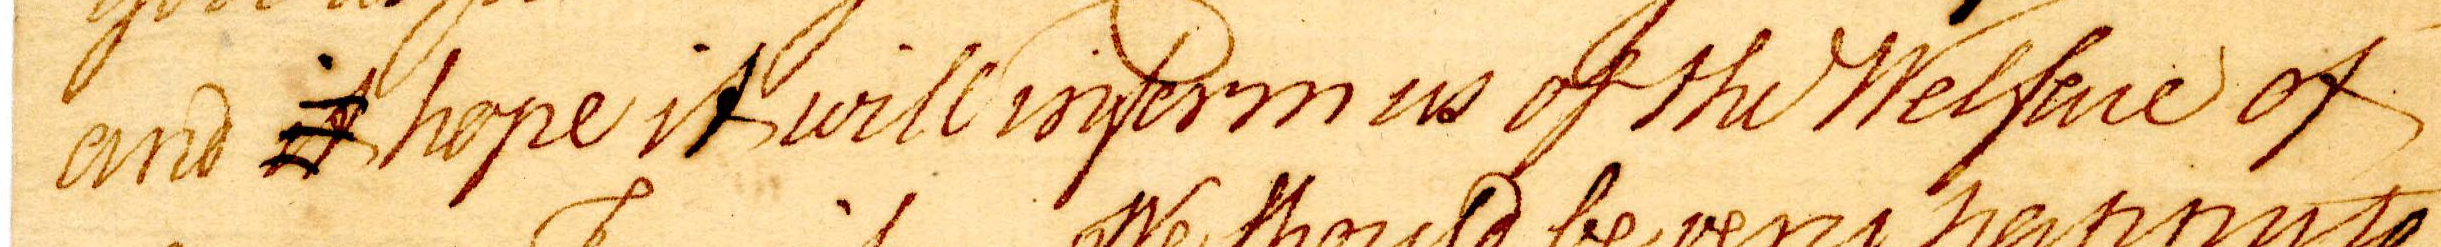and [_] hope it will inform us of the Welfare of
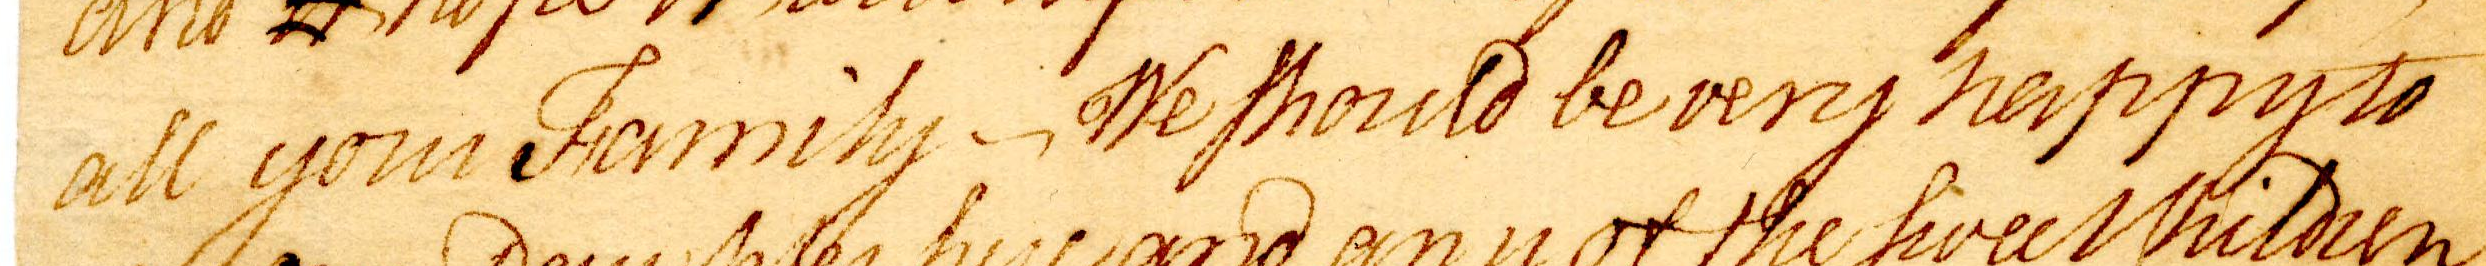all your Family. We should be very happy to
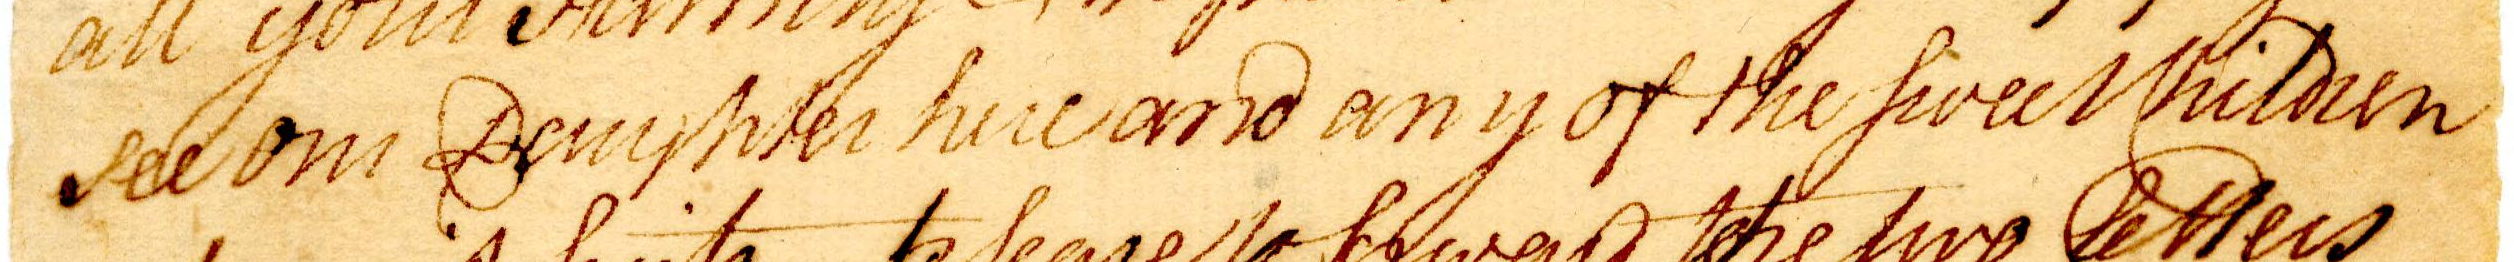see our Daughter here and any of the five children
